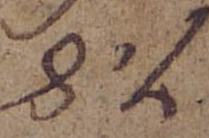7.8
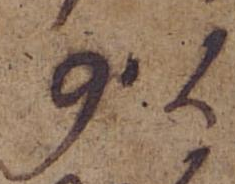7.6
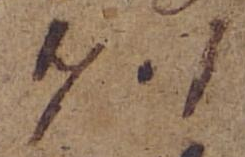1.4
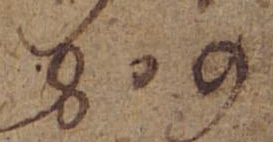6.8
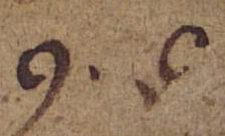5.6
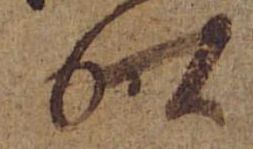7.9
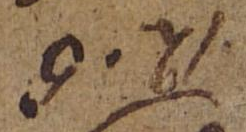12.5
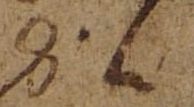7.8
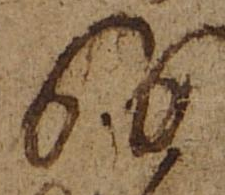9.9
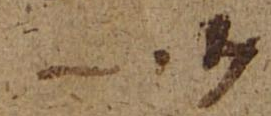4.-
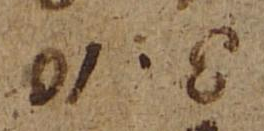3.10
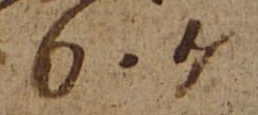4.9
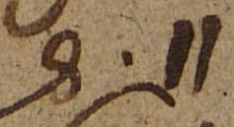11.8
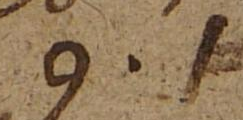1.6
